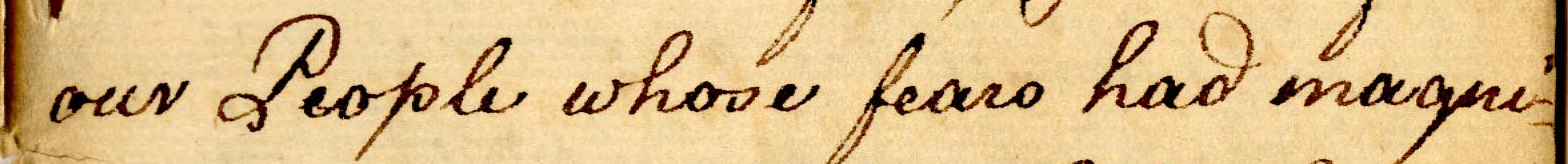our People whose fears had magni-
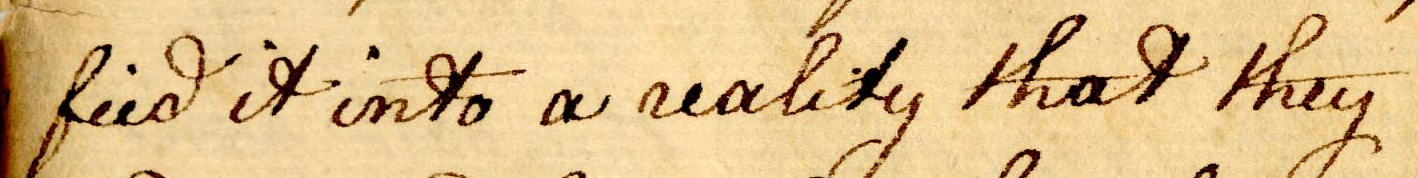fied it into a reality that they
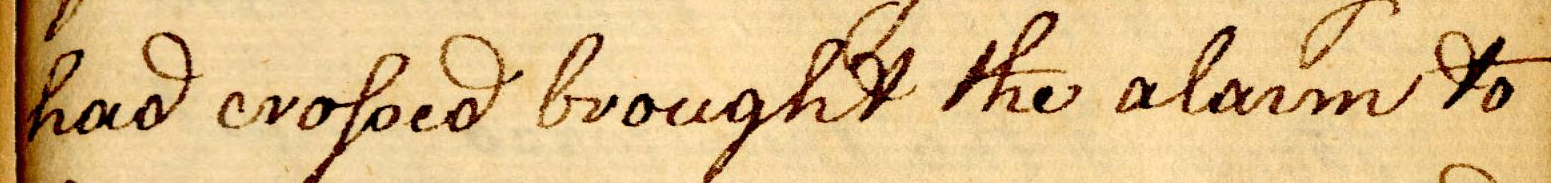had crossed brought the alarm to
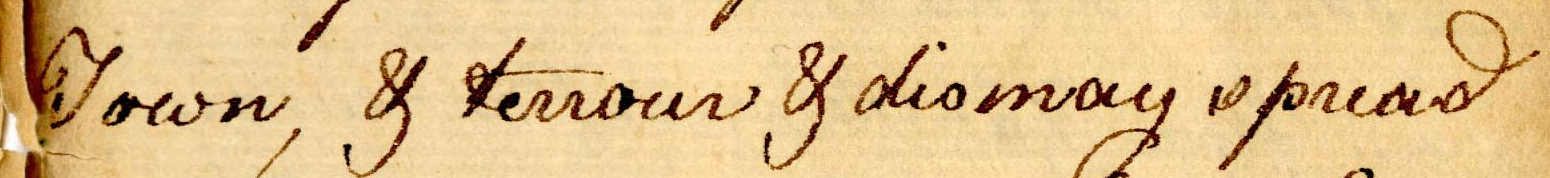Town, & terrour & dismay spread
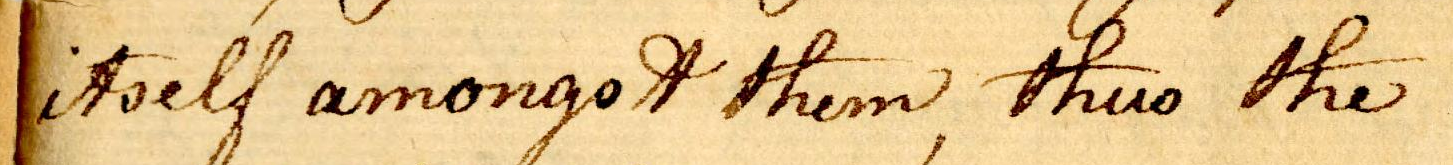itself amongst them, thus the
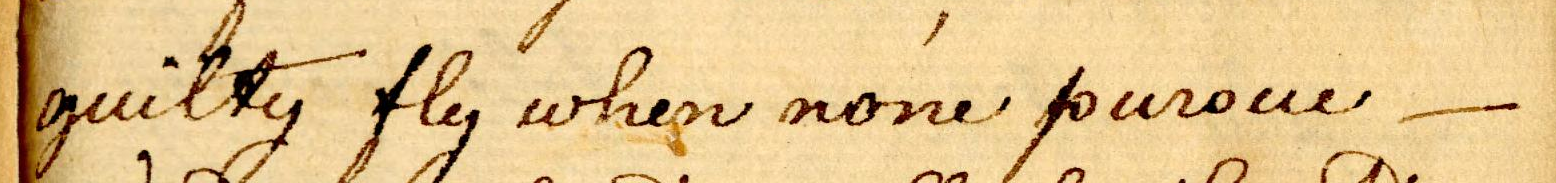guilty fly when none pursue-
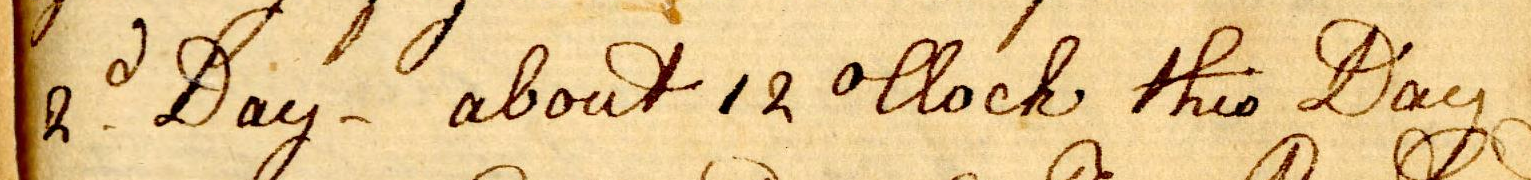2^d. Day- about 12 ^oClock this Day
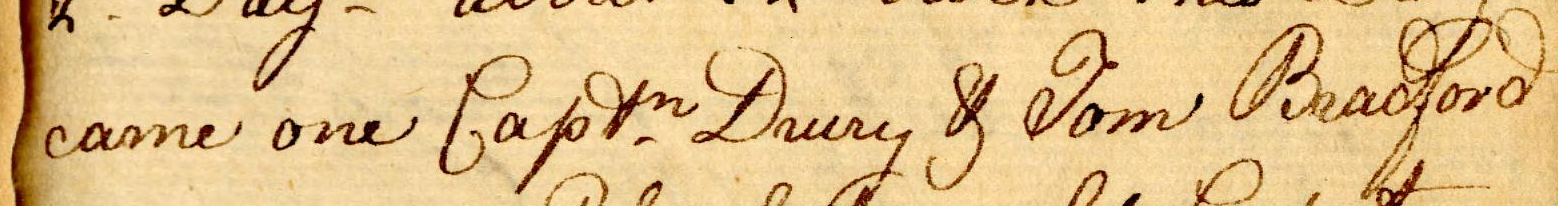came one Capt^n Drury, & Tom Bradford
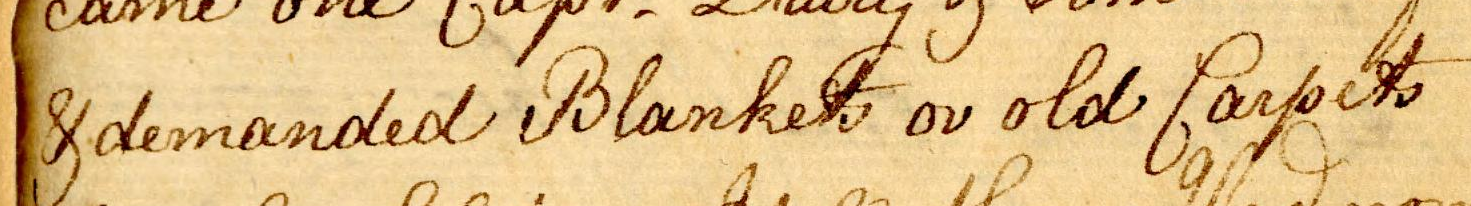& demanded Blankets or old Carpets
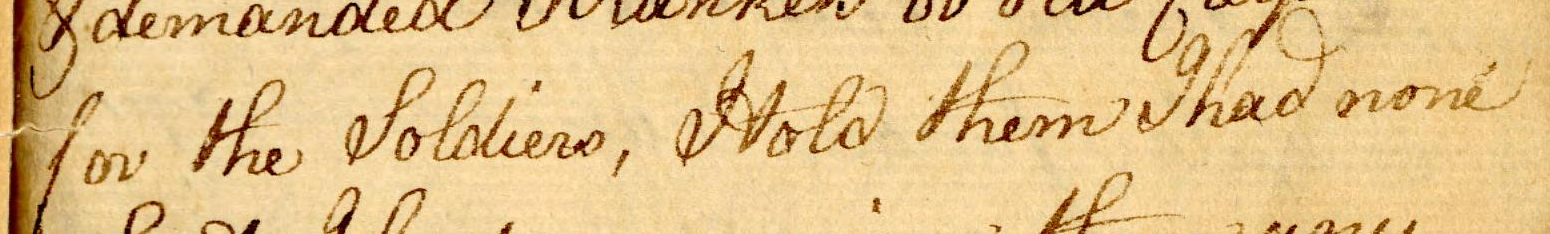for the Soldiers, I told them I had none
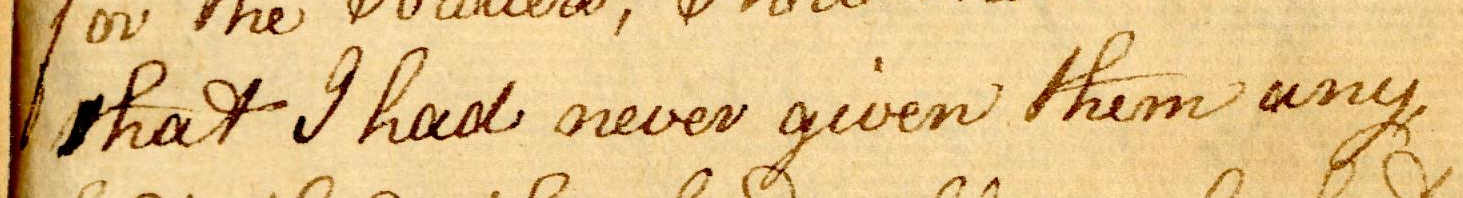that I had never given them any,
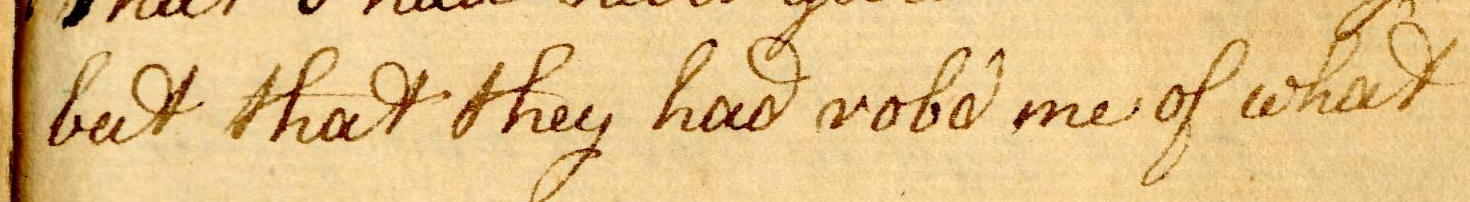but that they had robd me of what
